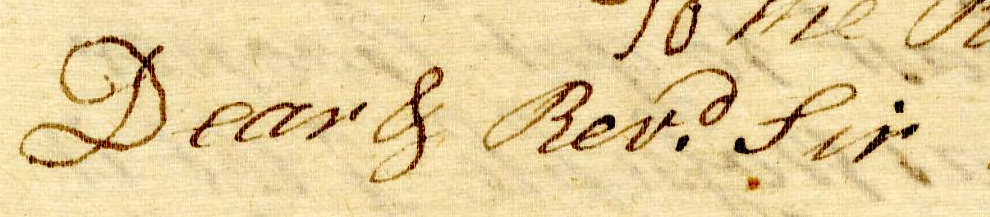Dear & Rev^d. Sir
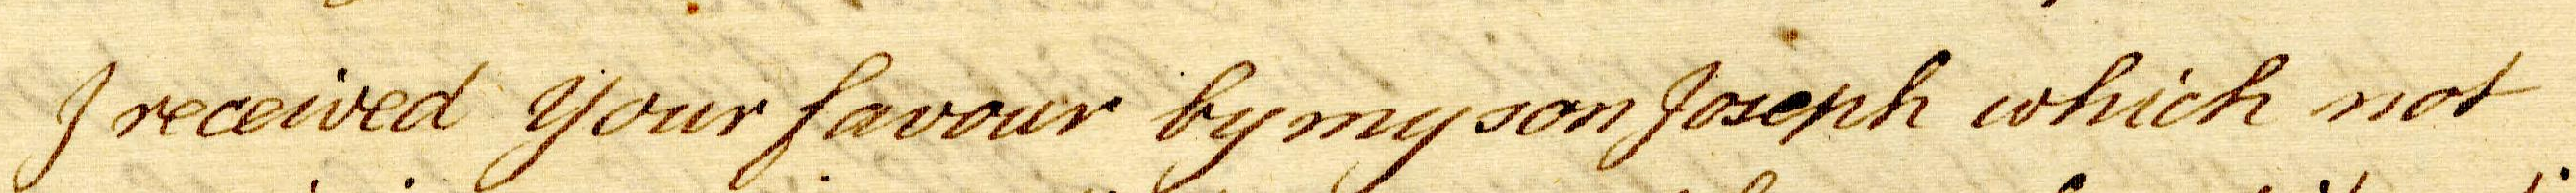I received Your favour by my son Joseph which not
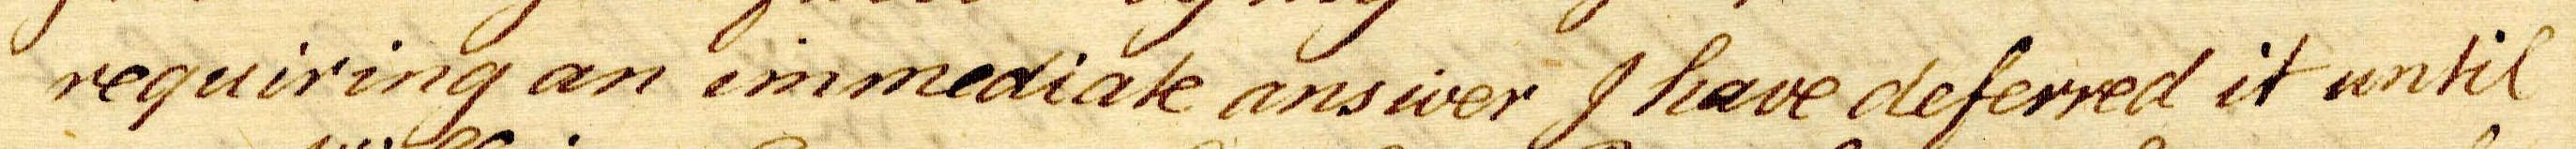requiring an immediate answer I have deferred it until
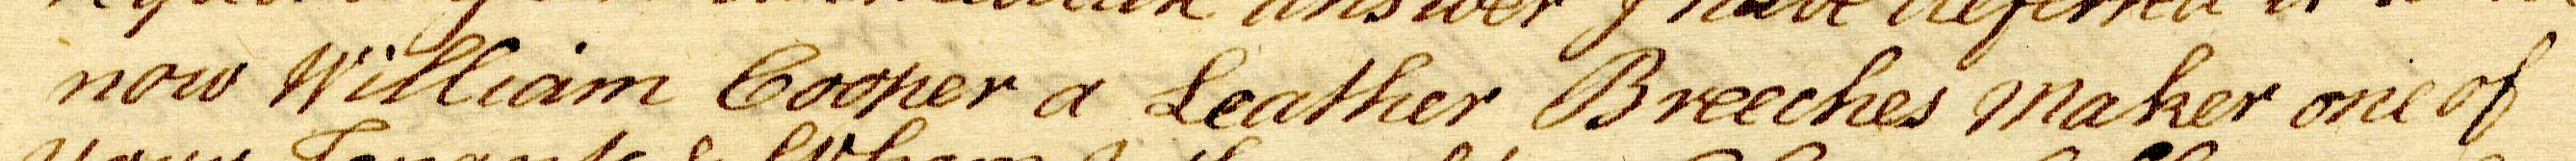now William Cooper a Leather Breeches maker one of
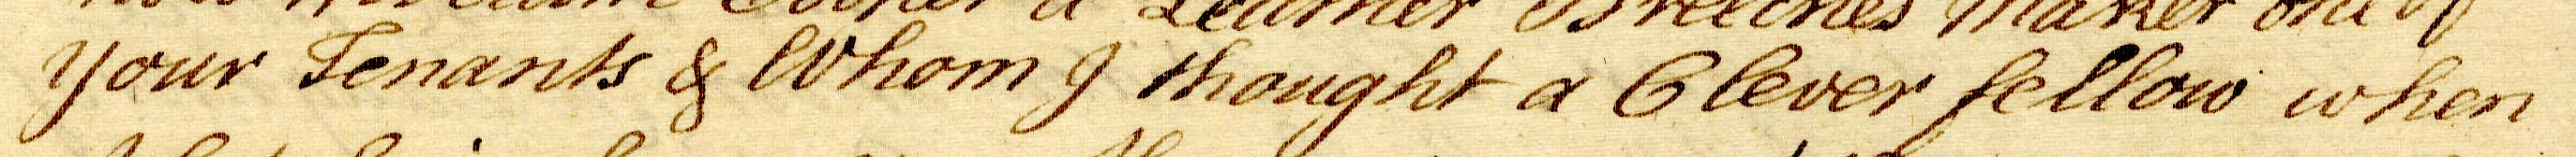Your Tenants & Whom I thought a Clever fellow when
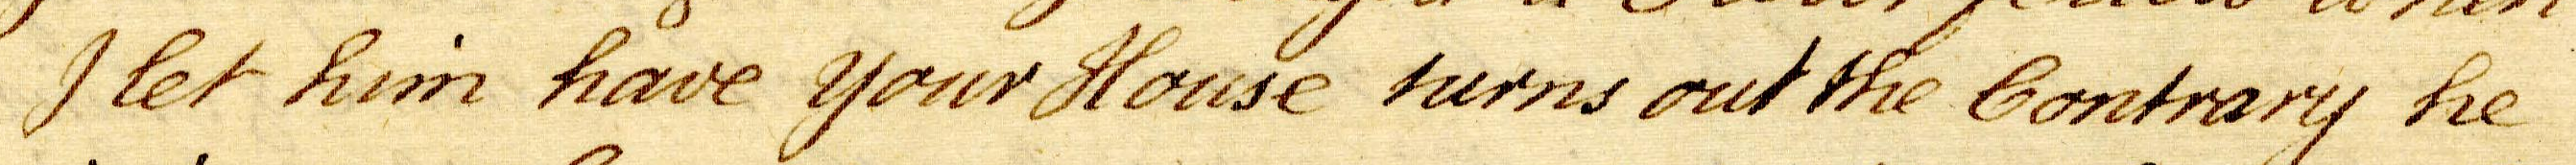I let him have Your House turns out the Contrary he
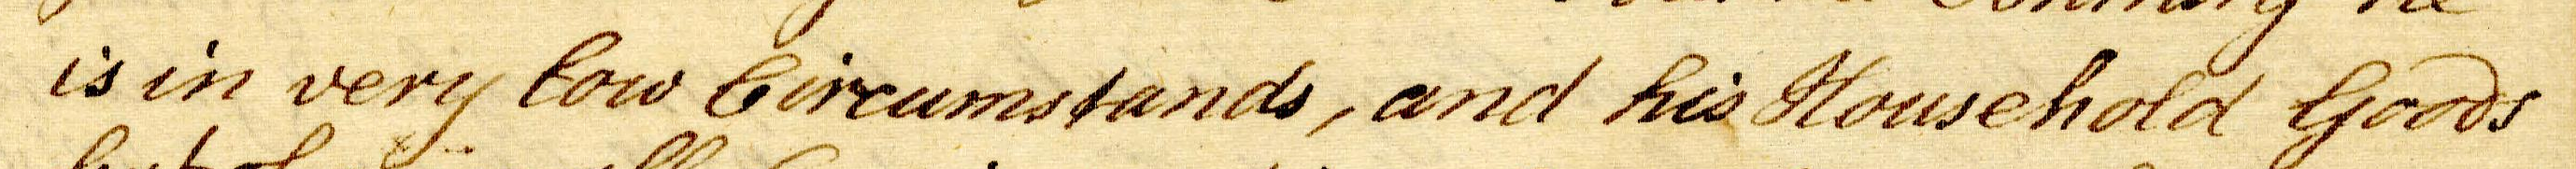is in very low Circumstands, and his Household Goods
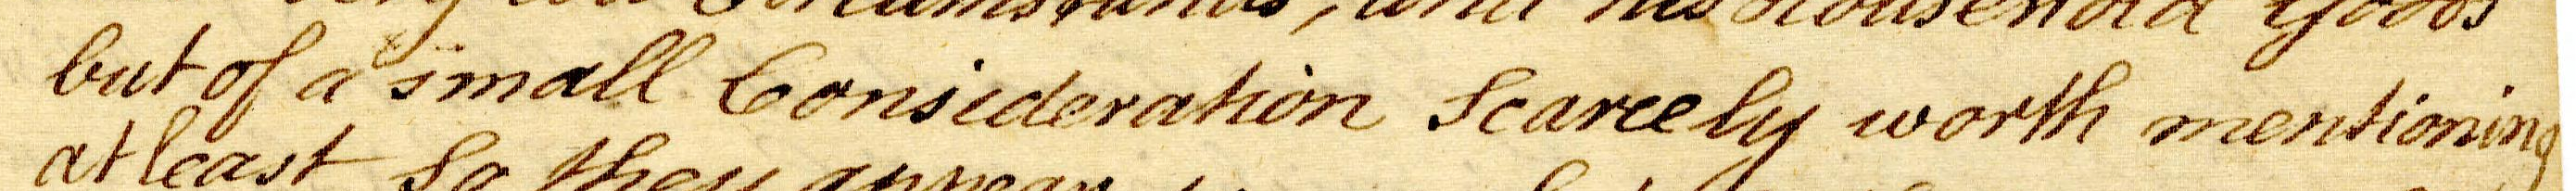but of a small Consideration Scarcely worth mentioning
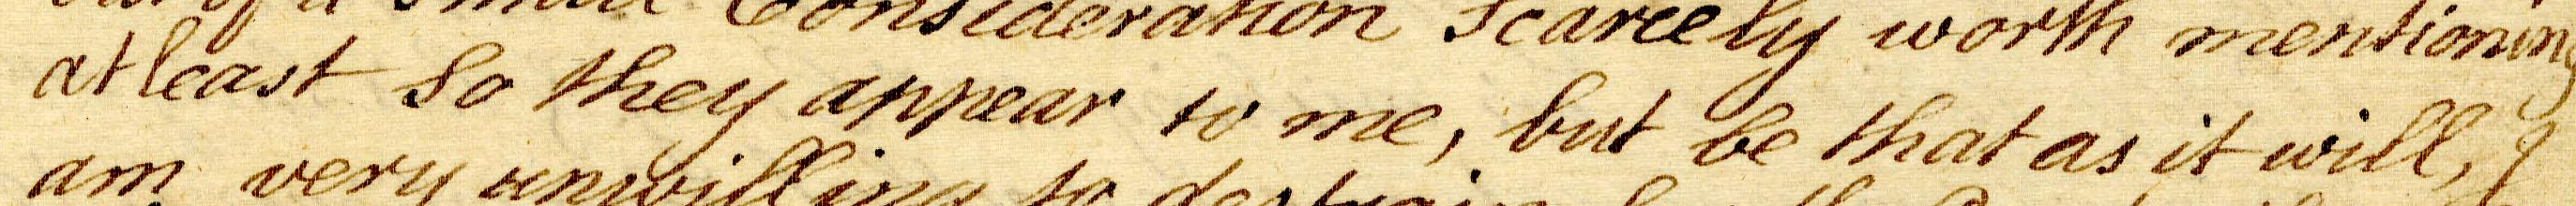at least So they appear to me, but be that as it will, I
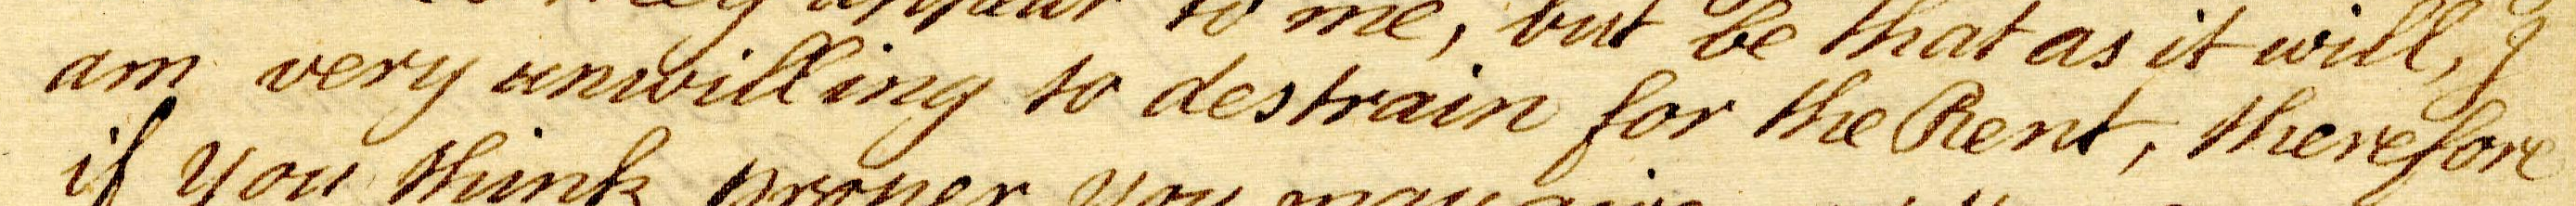am very unwilling to destrain for the Rent, therefore
